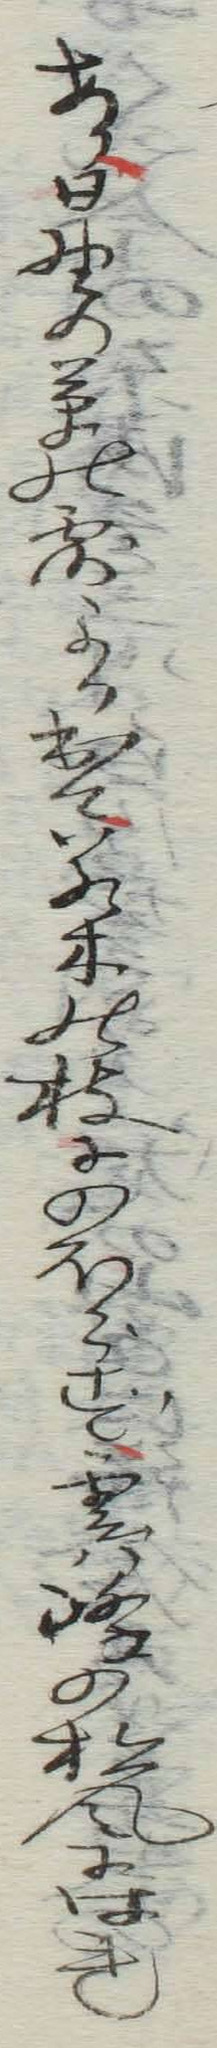あり、日野の草の露より出て、若木の枝にのほらず、雲は峰の松風にはれ
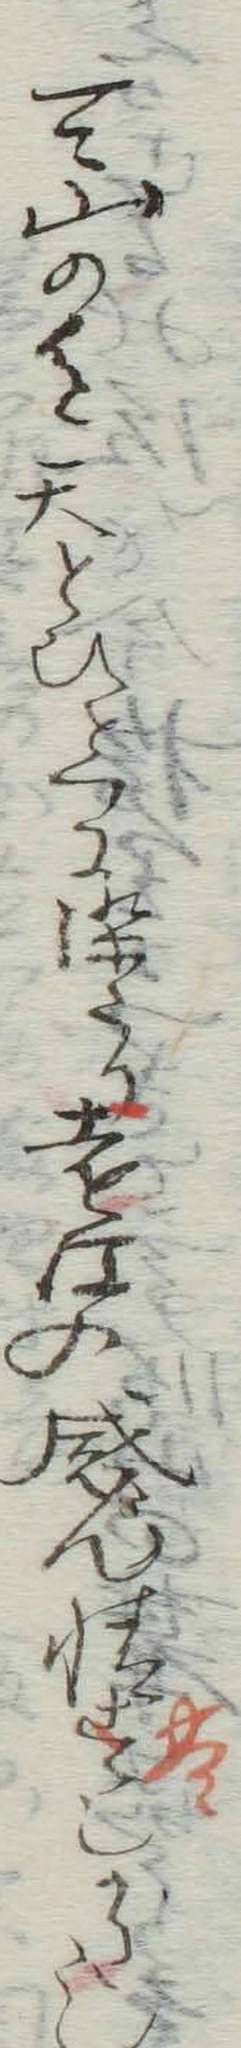て山の色天とひとつに染たり、遠江の感心情尽しかたし、
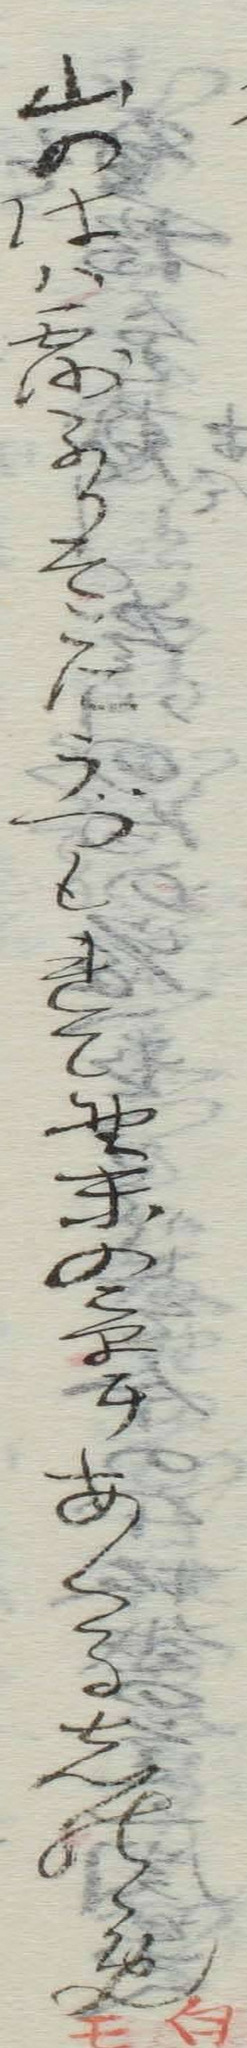山のはは露よりそこにうづもれて野末の草にあくるしのゝめ白モ
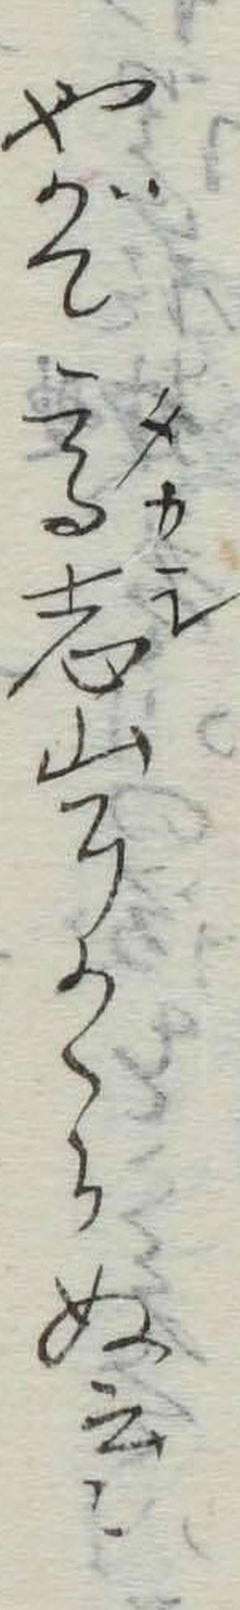やがて高志山にかゝりぬ云々
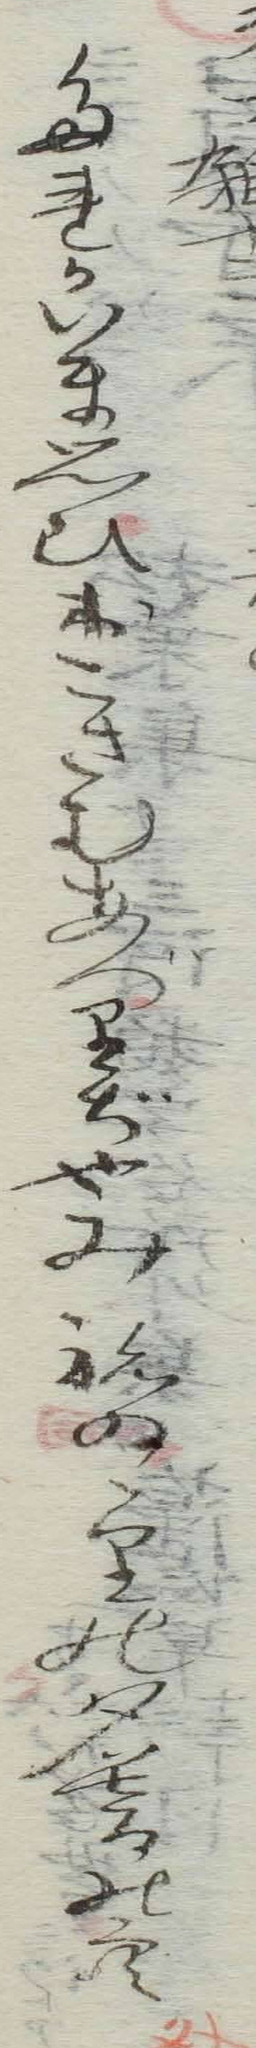たれかいま思ひおこさむあづまぢやみねのゝ里の夕暮れの空外
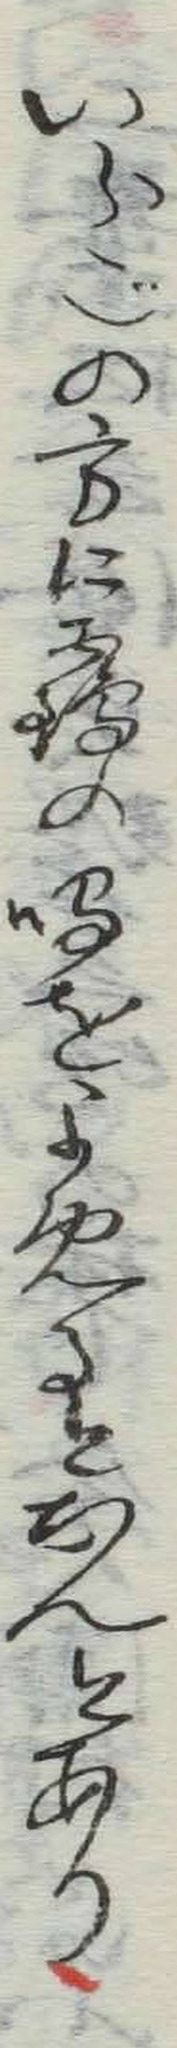いらごの方に靏の鳴をよめるとなんとあり、

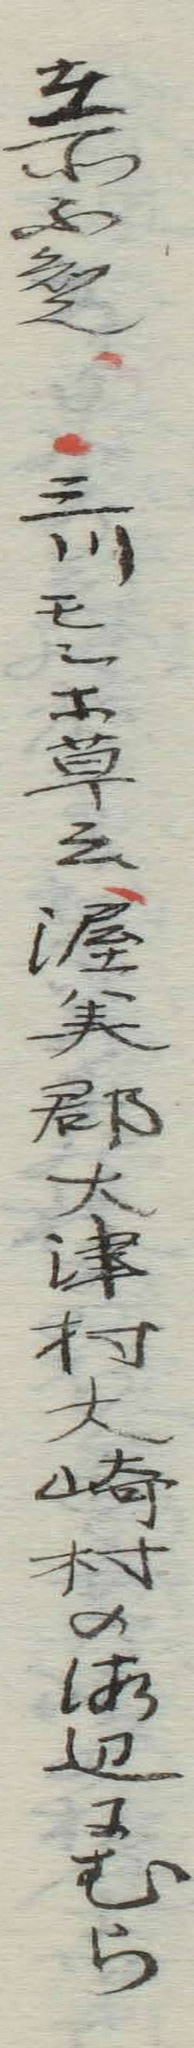在所不知也、●三川モシホ草云、渥美郡大津村大崎村の海辺にむら
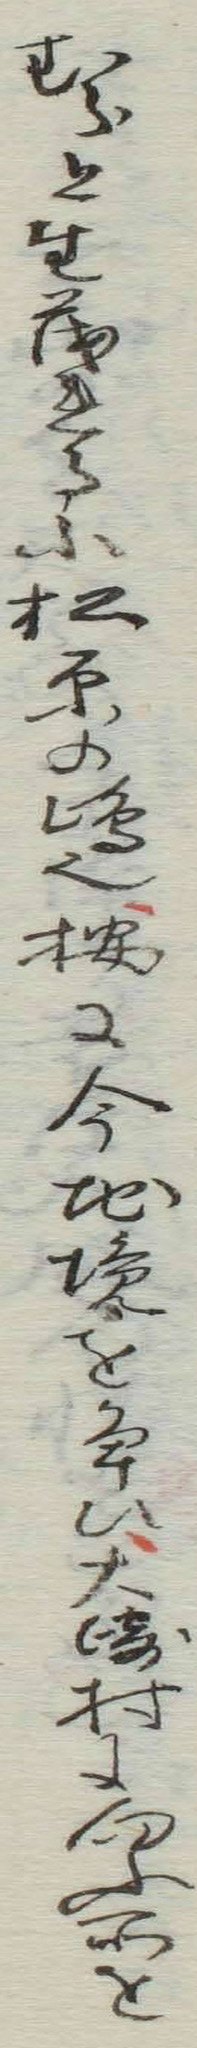むらと生茂れる小松原の島也、按に今地境を争ひ、大崎村に向ふ所を
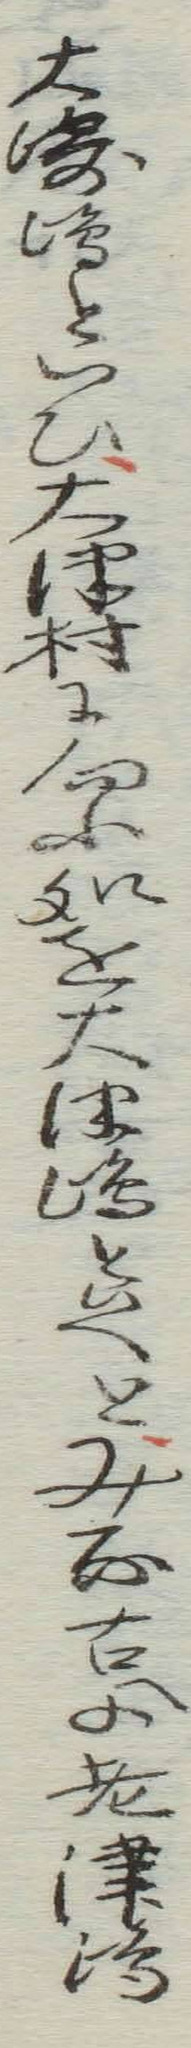大崎島といひ、大津村に向ふ処を大津島といへと、みな古への老津島
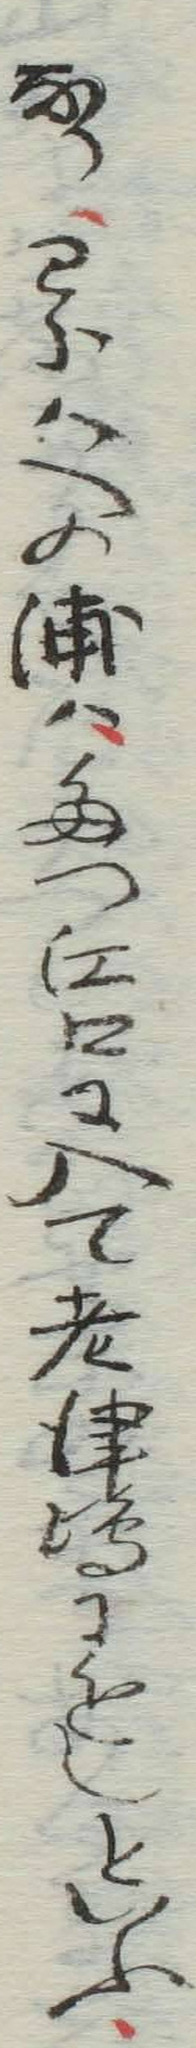なり、わらはへの浦は、たつ江口に入て老津島に近しといふ、
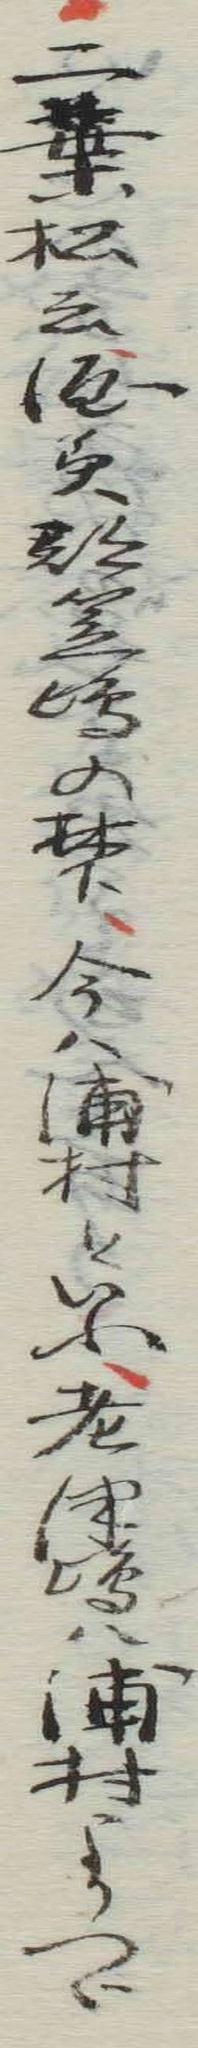●二葉松云、渥美郡笠島の梺、今は浦村といふ、老津島は浦村よりつゞ
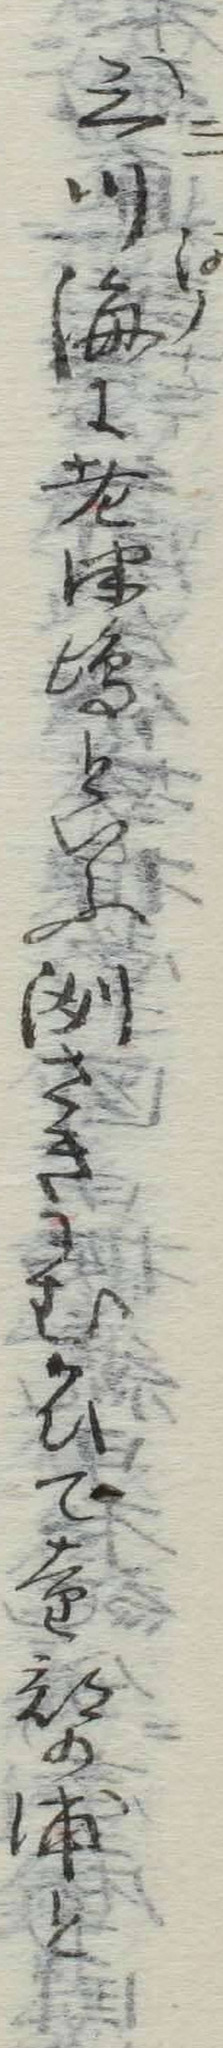三川海に老津島といふ洲さきにむかひて童部の浦と
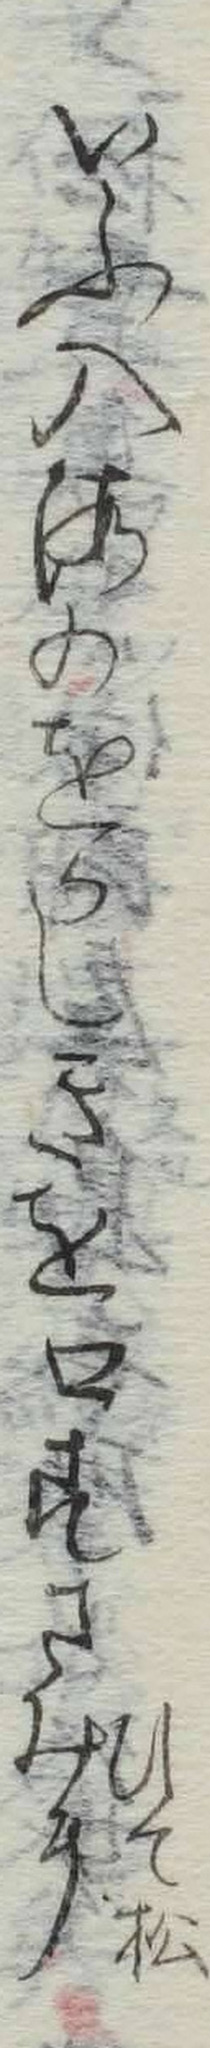いふ入海のをかしきを口すさみに
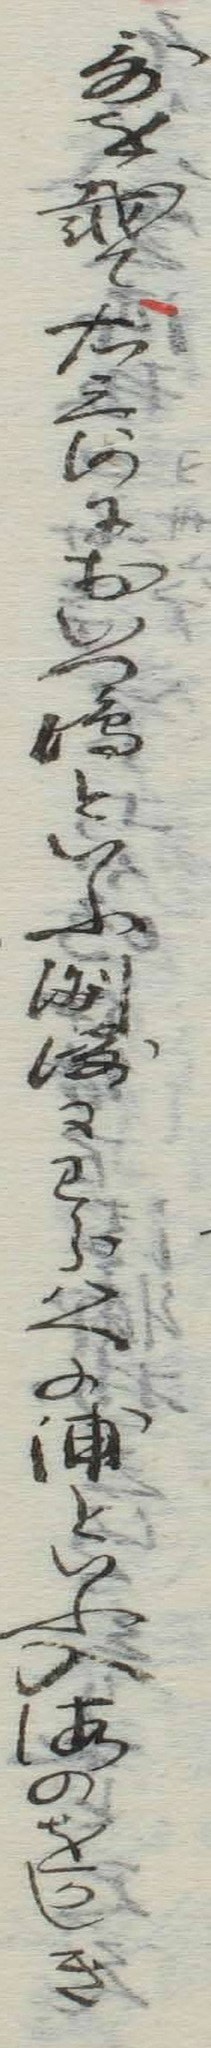歌を載て、右三河においつ島といふ洲崎にわらはへの浦といふ入海のをかしき
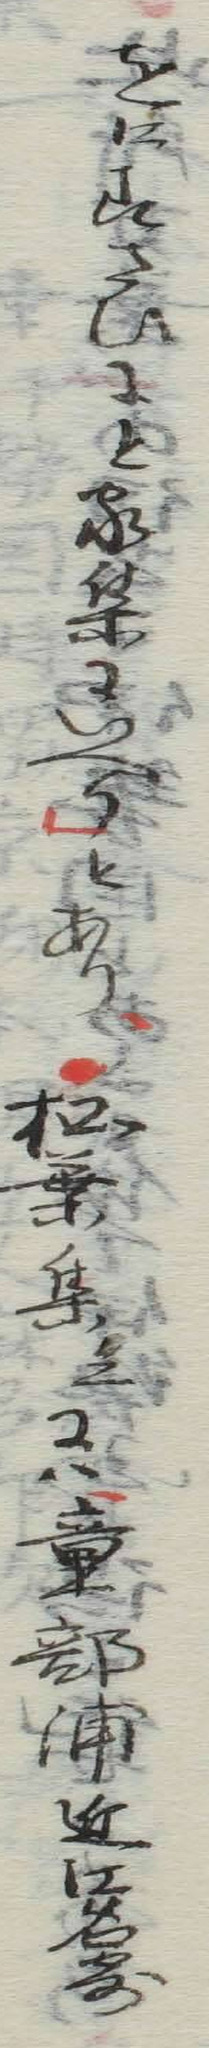を口すさひにと家集にいへり」とあり、●松葉集三には、童部浦近江名寄

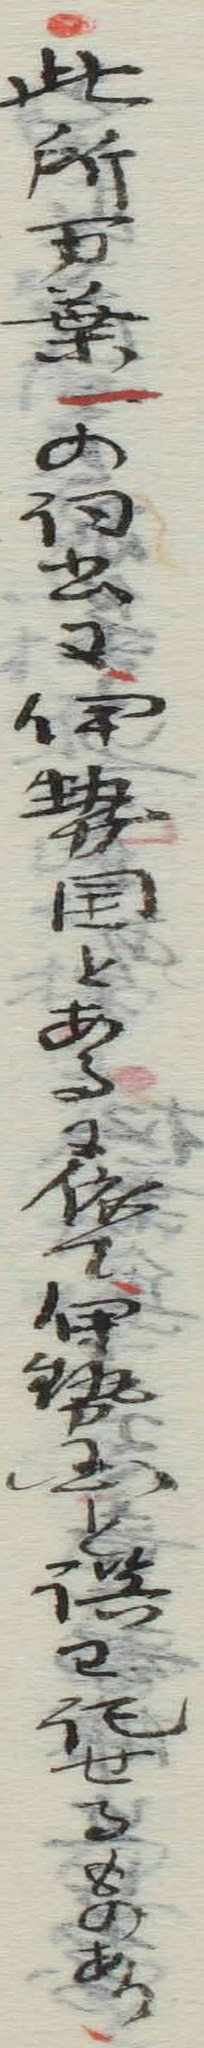●此所万葉一の詞書に、伊勢国とあるに依て、伊勢国と誤リ記せるものあり、
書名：三河国古跡考
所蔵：国文学研究資料館
